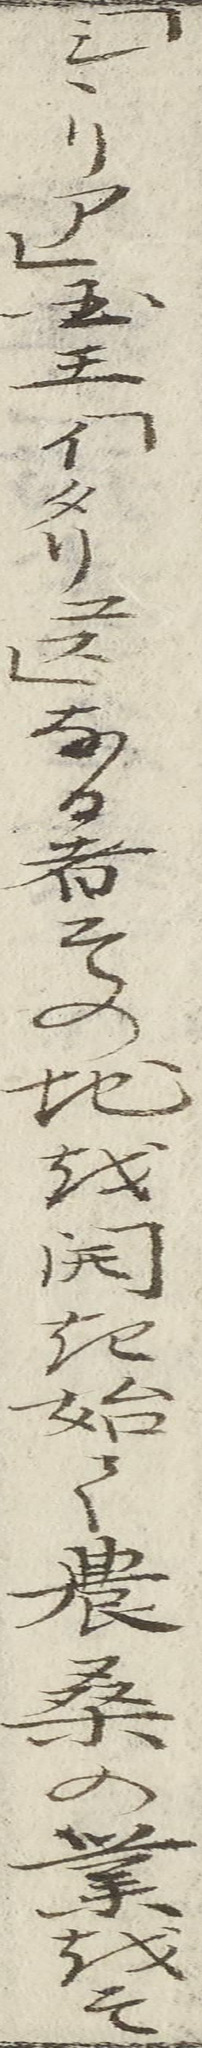「シゝリア」国王「イタリュス」なる者その地を開き始て農桑の業をその
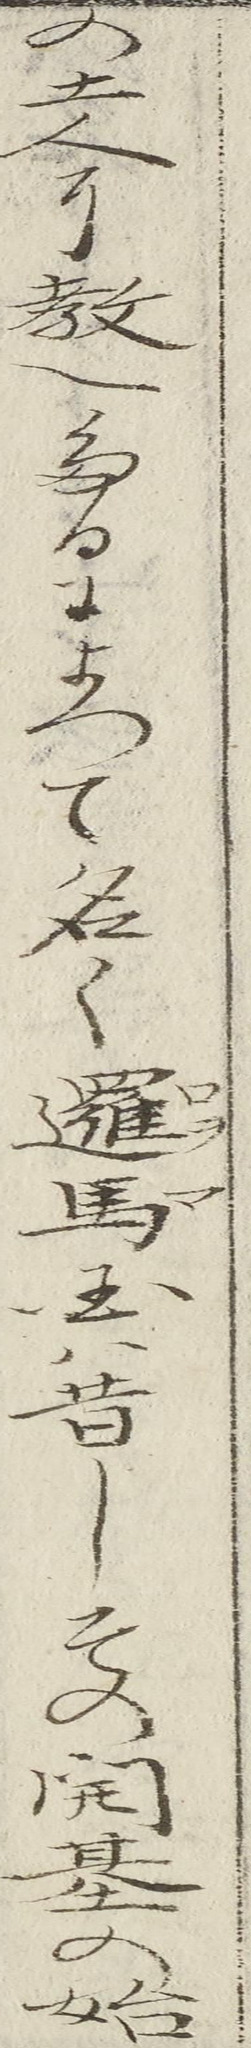土人に教へたるによつて名く邏馬国ハ昔しその開基の始
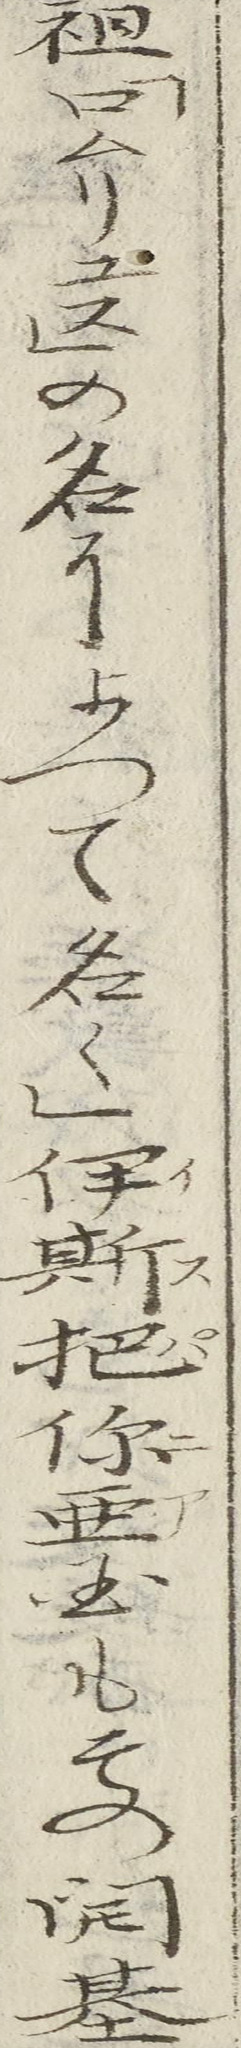祖「ロムリュス」の名によつて名く」伊斯把你亜国もその開基
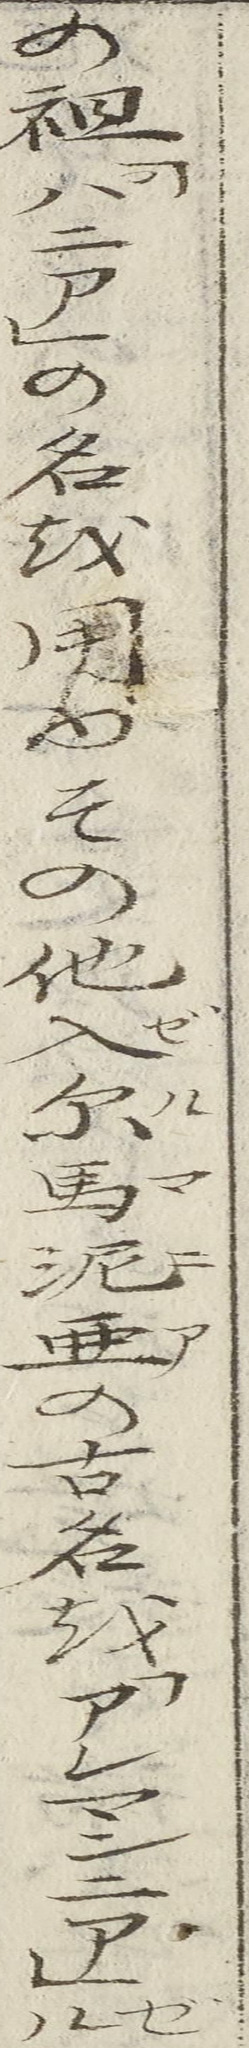の祖「パ二ア」の名を用ゆその他入尓馬泥亜の古名を「アンマン二ア」セル
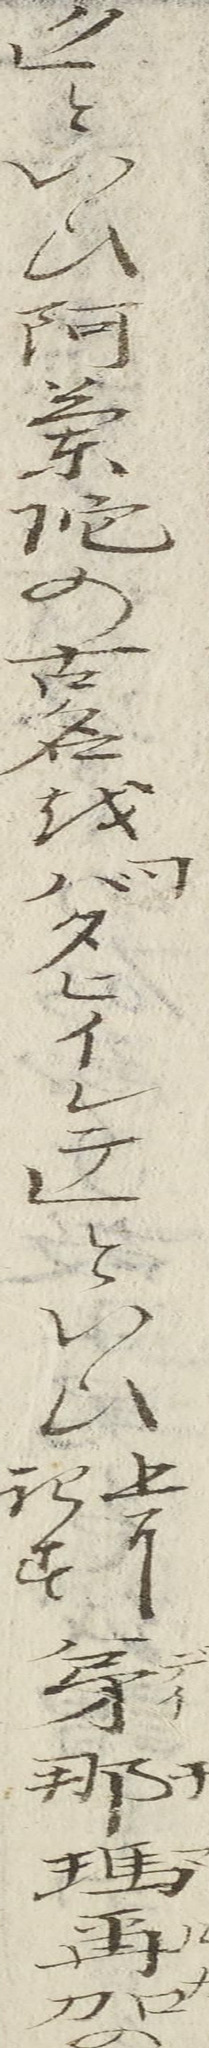ク」といひ阿蘭陀の古名を「バタヒイレテ」といひ上に記す第那瑪再加の
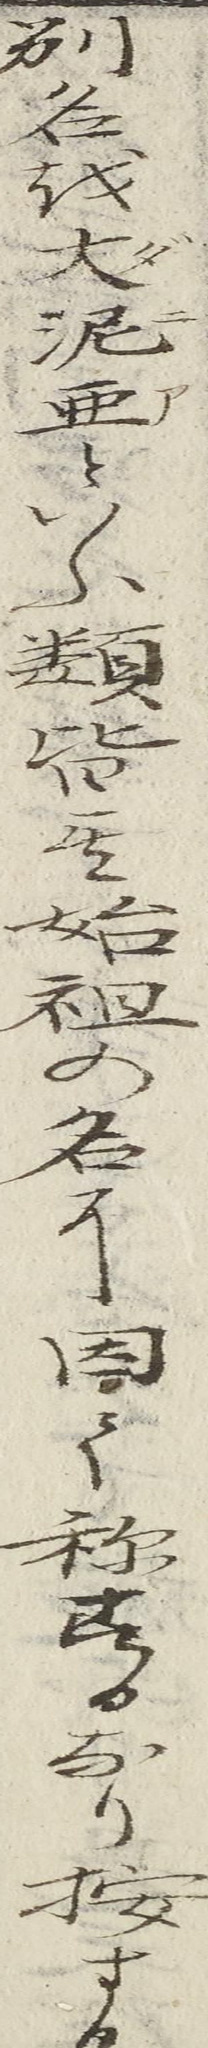別名を大泥亜といふ類皆其始祖の名に因て称するなり按する
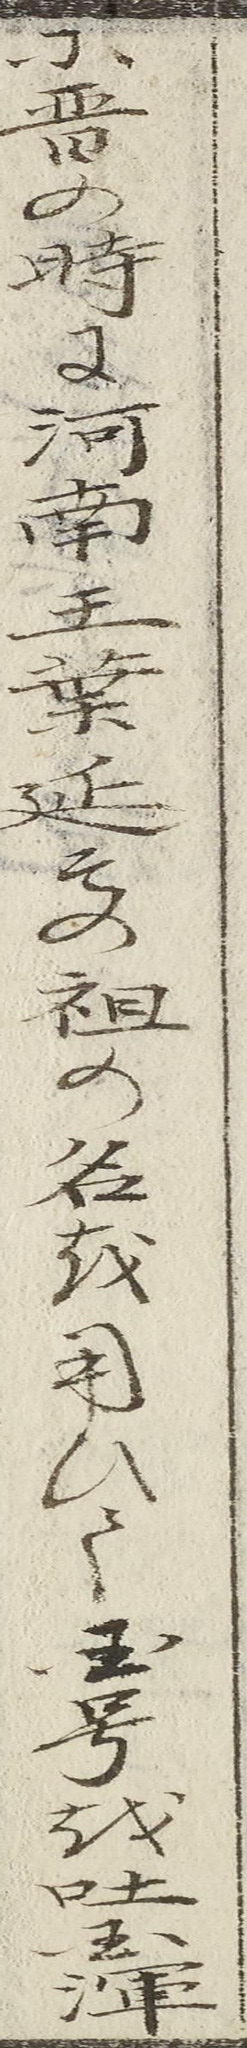に晋の時に河南王葉延その祖の名を用ひて国号を吐国渾
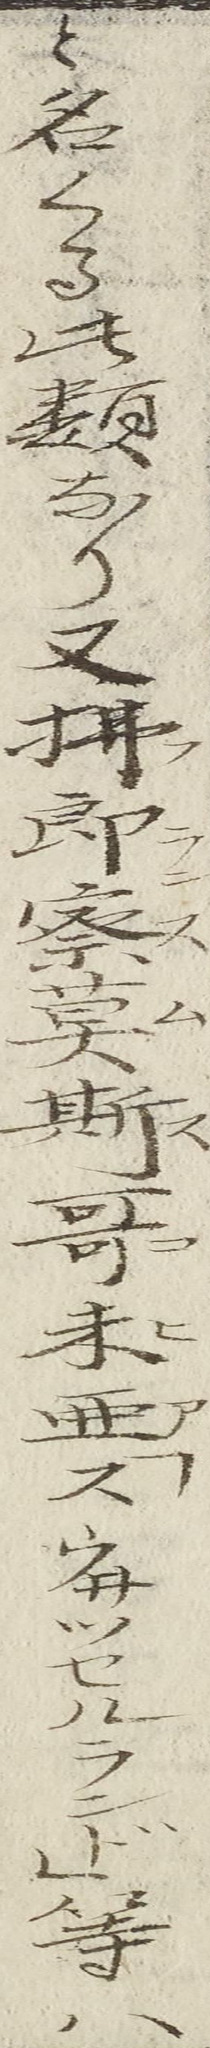と名くる此類なり又拂即察莫斯哥未亜「スウ井ツセルランド」等は
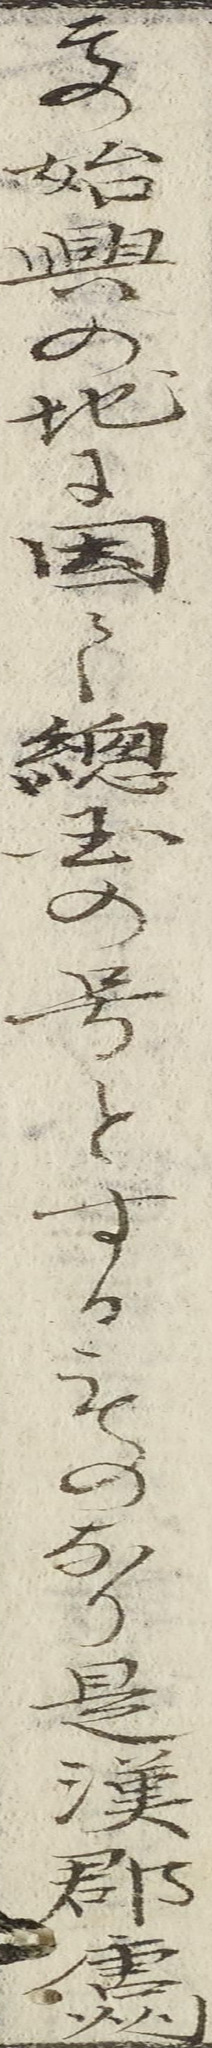その始興の地に因て総国の号とするものなり是漢郡唐州
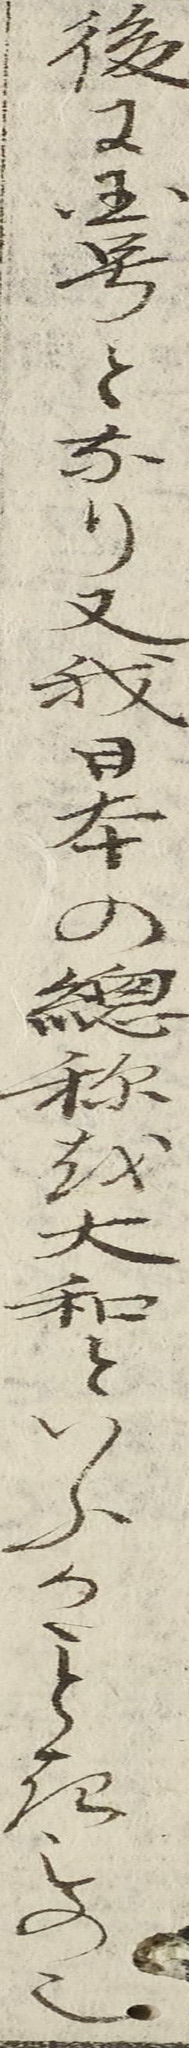後に国号となり又我日本の総称を大和といふかこときもの也
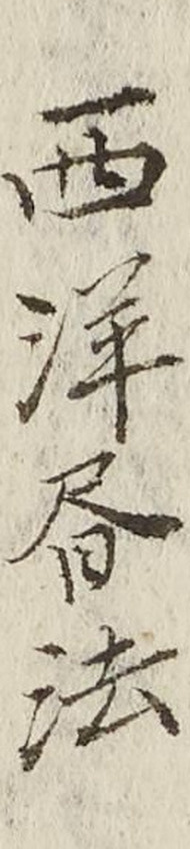西洋書法
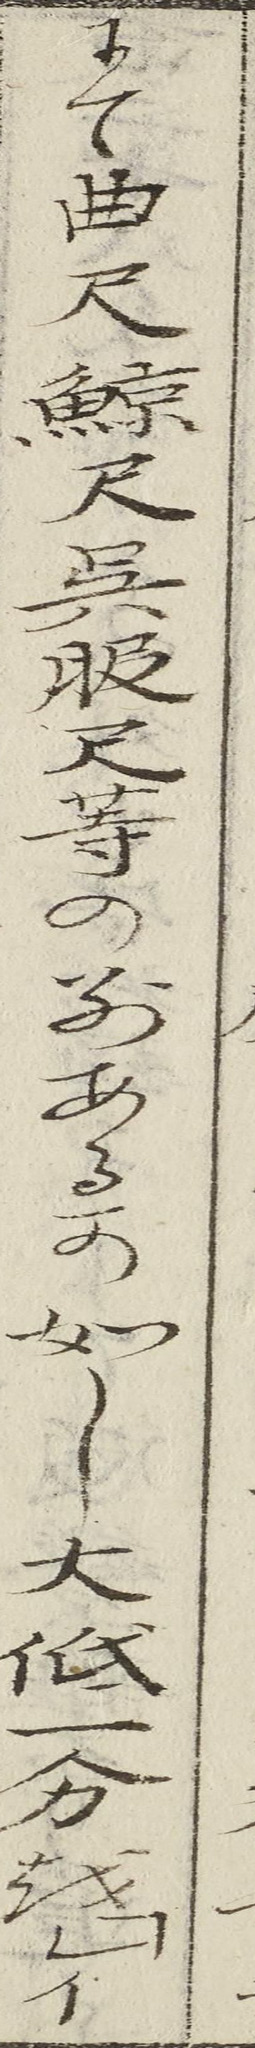にて曲尺鯨尺呉服借等の別あるか如し大低一分を「レイ
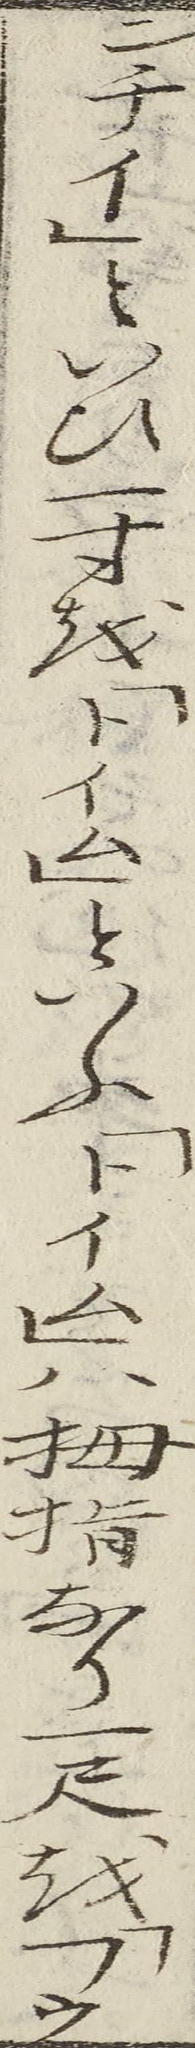ンチイ」といひ一寸を「トイム」といふ「トイム」ハ拇指なり一尺を「フゥ
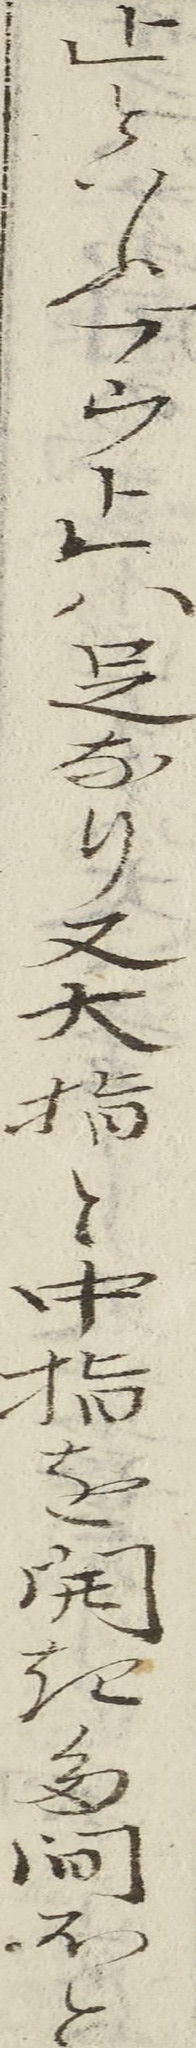ト」といふ「フゥト」ハ是なり又大指と中指を開きたまほと
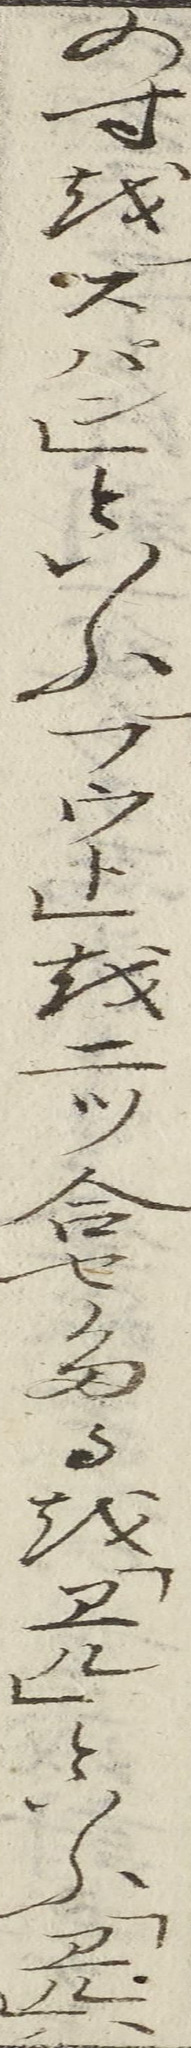の寸を「スバン」といふ「フゥト」を二ツ合せたるを「ヱル」といふ「ヱル」ハ
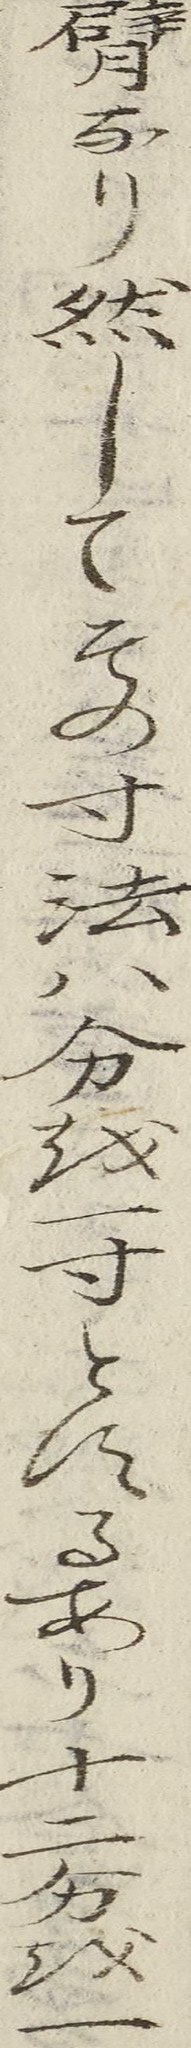臂なり然してその寸法は分を一寸とするあり十二分を一
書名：西洋雜記　坤
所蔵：東京大学地震研究所図書室 Earthquake Research Institute Library, The University of Tokyo, JAPAN
